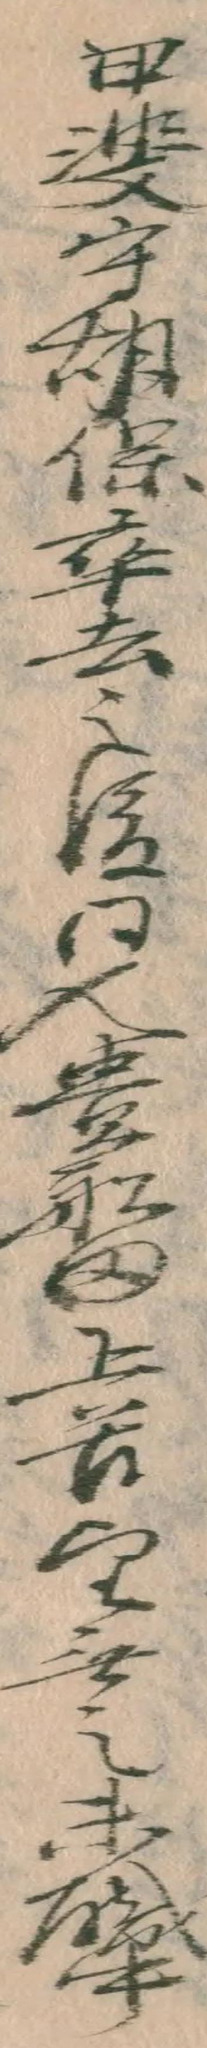甲斐守胡保卒去之後同人貴舩田上首望無之未職中
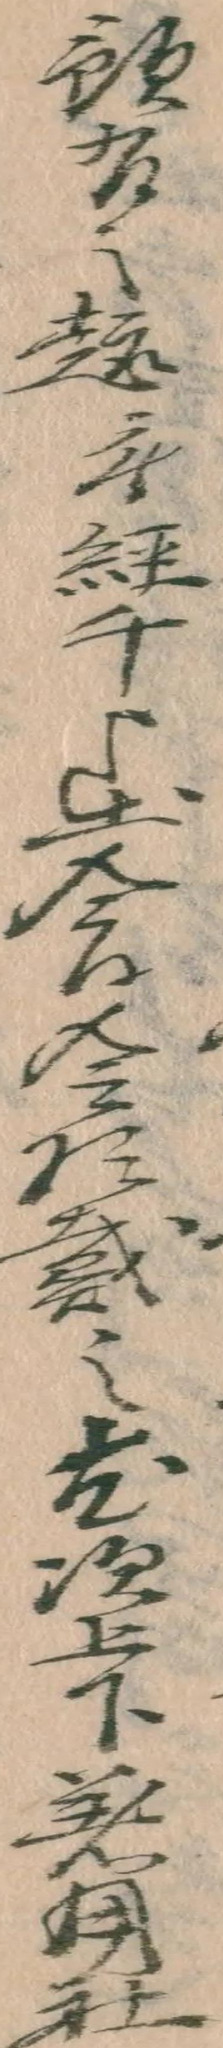預有之趣ニ付経千申出今日令頂戴之尤次上下着用社
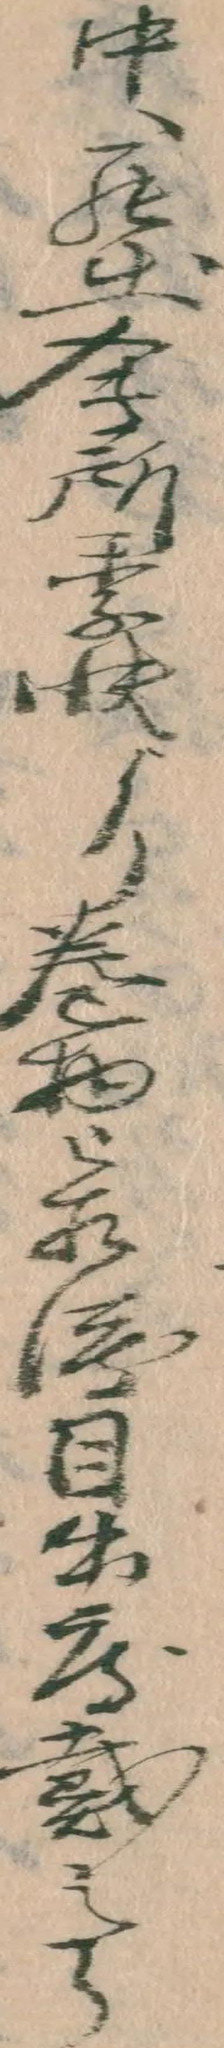中へ罷出會所季快より巻物被相渡目出度戴之了
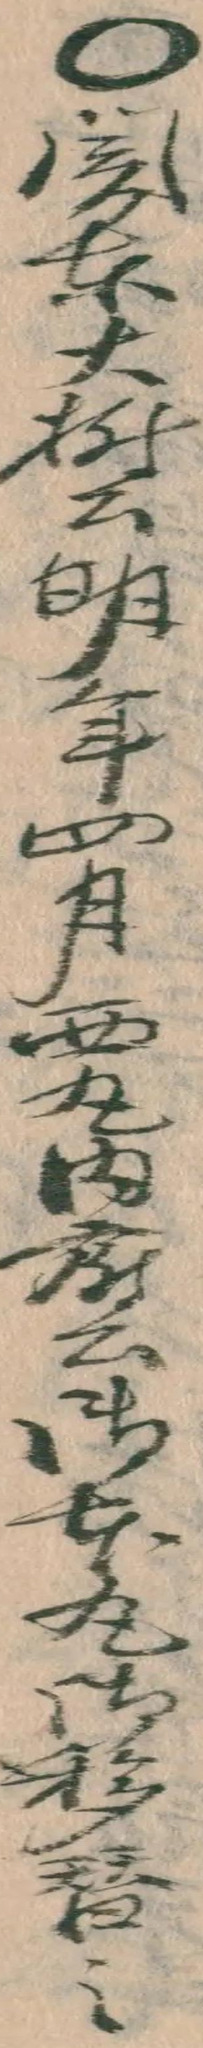○関東大樹公明年四月西丸内府公御本丸御移替之
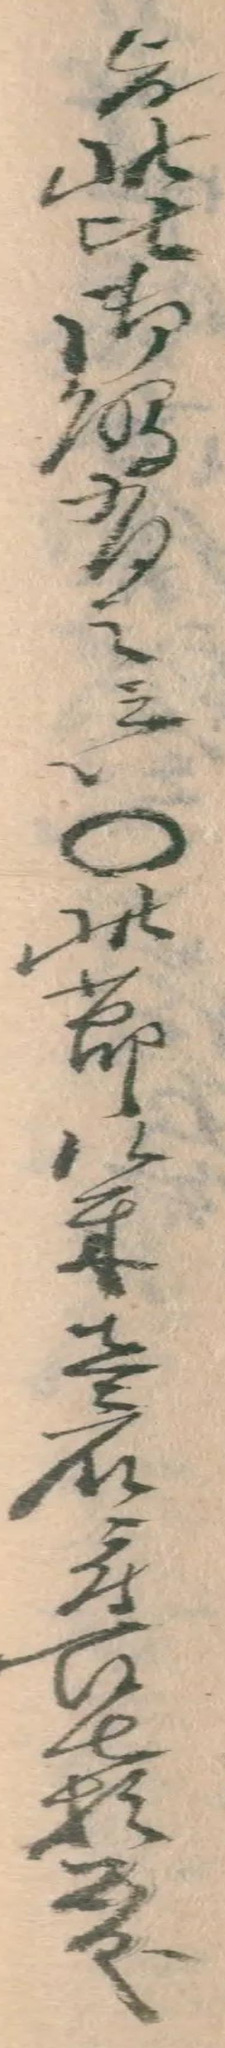旨此比御觸有之云々○此節以来壱石ニ付百七拾五匁
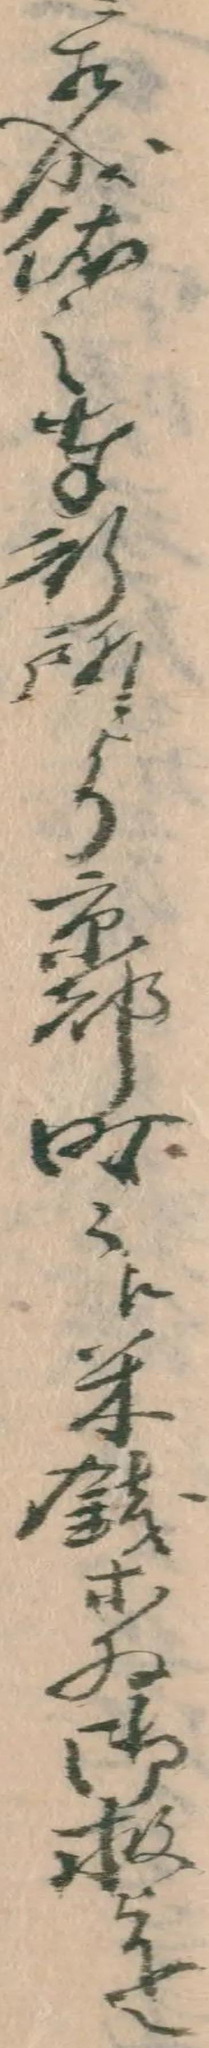ニ相成依之奉行所より京都時々え米銭等為御救被下之
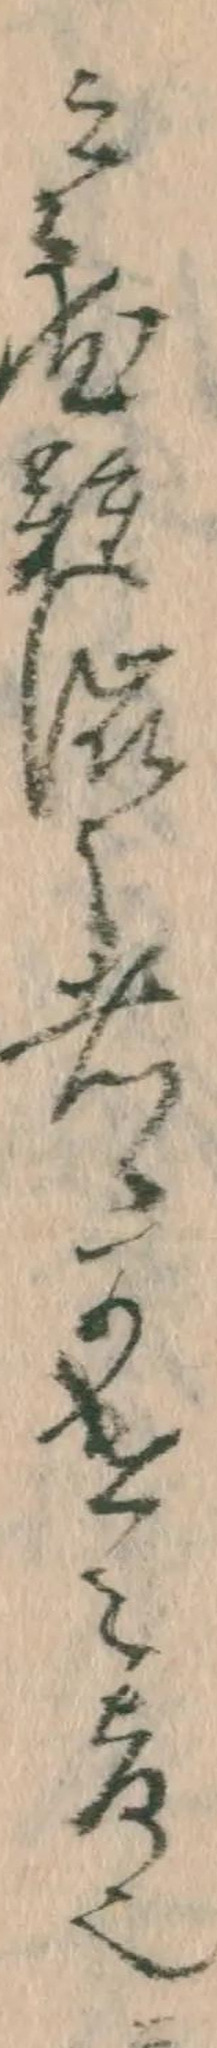之面難渋之者へ可遣之旨也
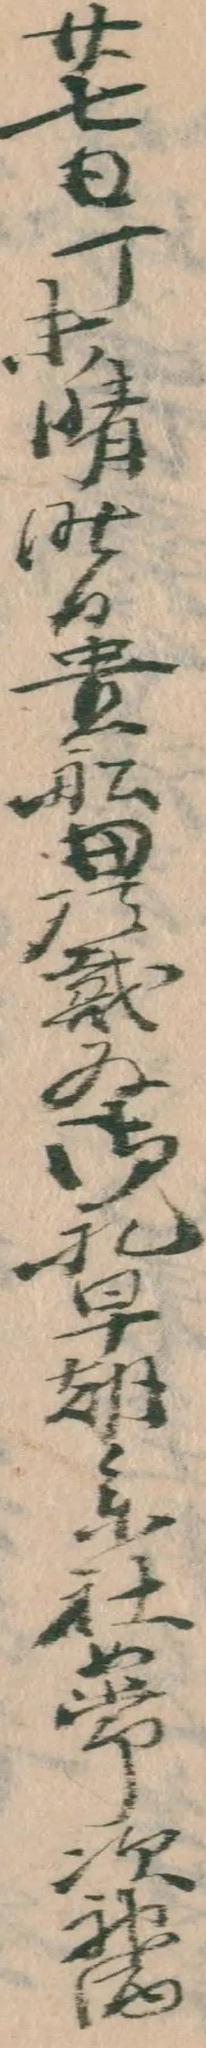廿七日丁未晴昨日貴舩田頂戴為御礼早朝参社如常次神酒
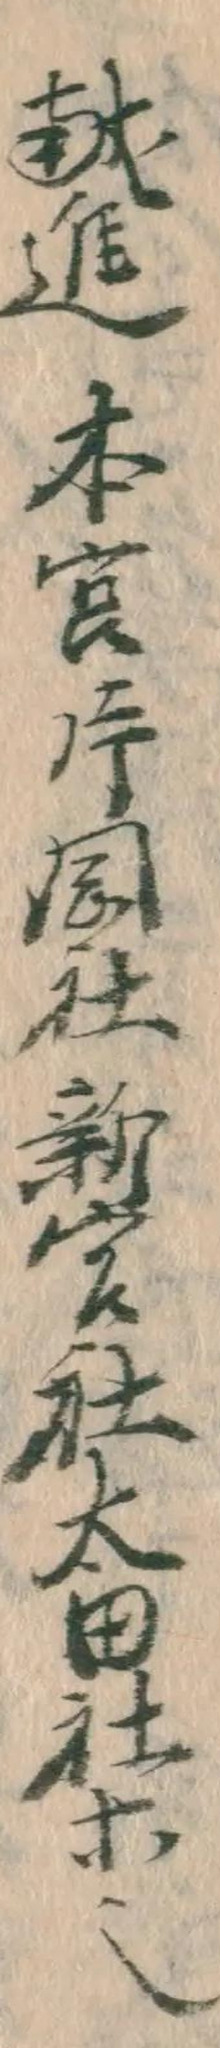献進本宮片岡社新宮社太田社等也
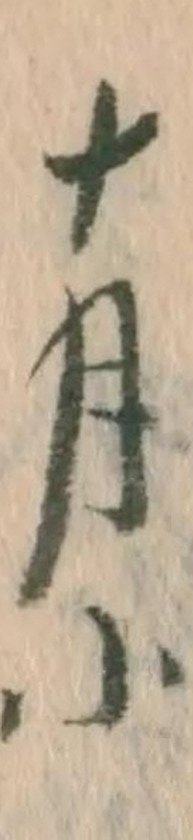十月小
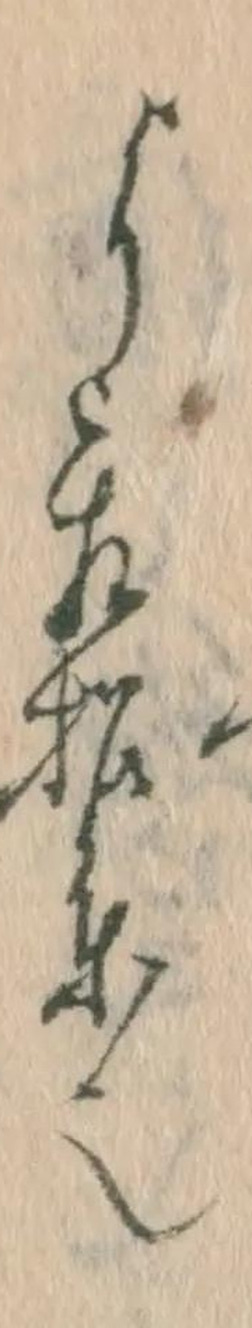より被相招参也
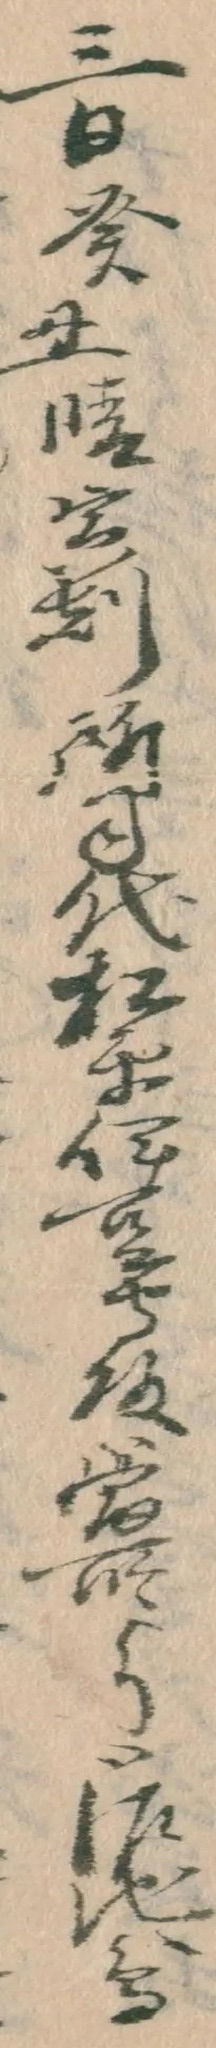三日癸丑晴寅刻御所司代松平伊豆守殿當所より御泥池へ鳥
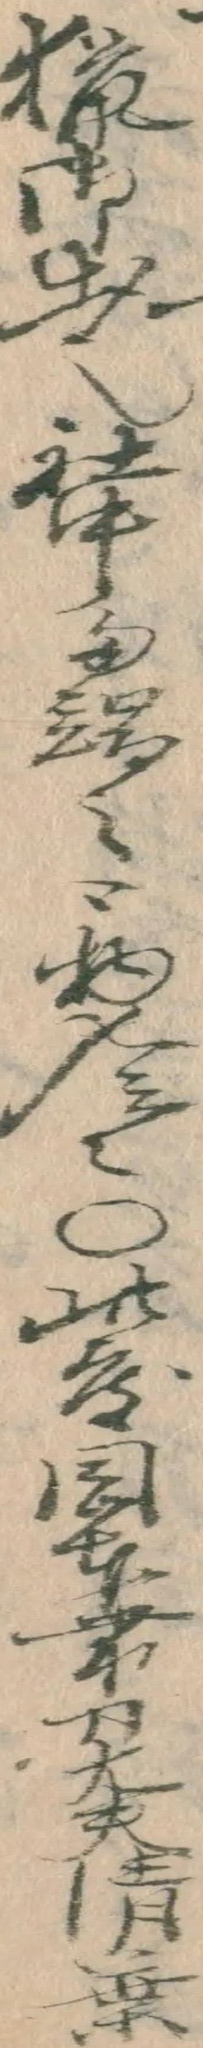猟御出也社中両端之御物入云々○此度岡本帯刀大夫清葉
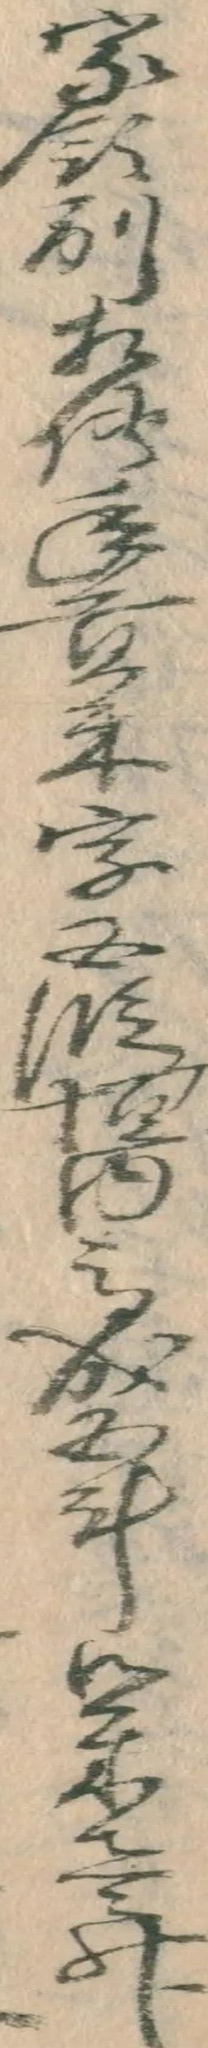家領別相傳年貢米字五段恒内高成五斗御米壱升
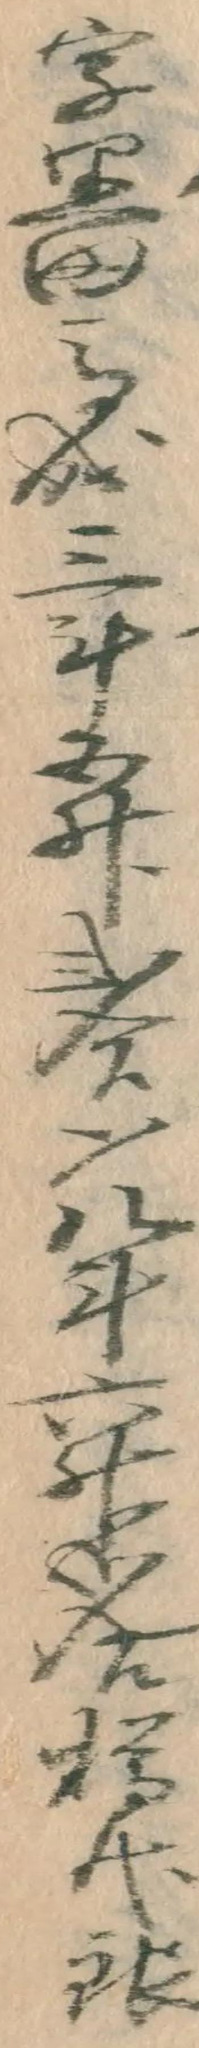字黒田高成三斗五升弐合〆八斗六升壱合樽代銀

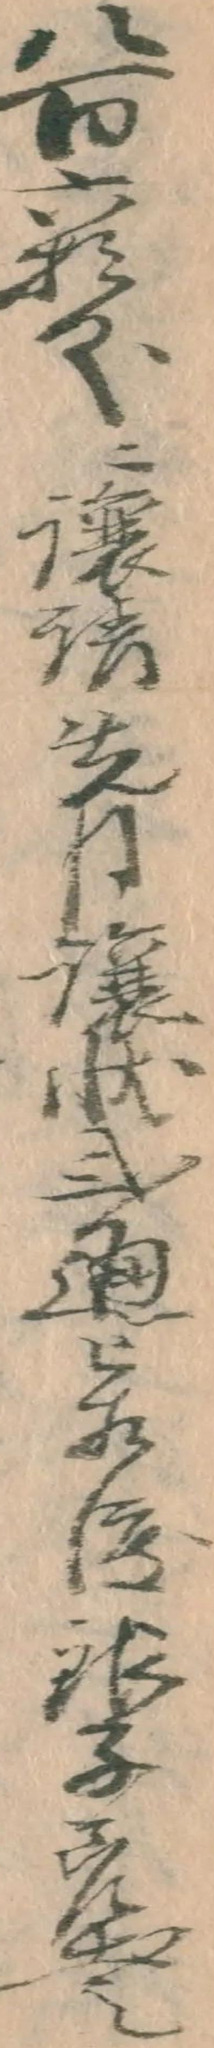八百六拾匁ニ譲請先月譲状弐通被相渡銀子差出之
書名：賀茂社記録. 第67冊
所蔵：国立国会図書館 National Diet Library, JAPAN
